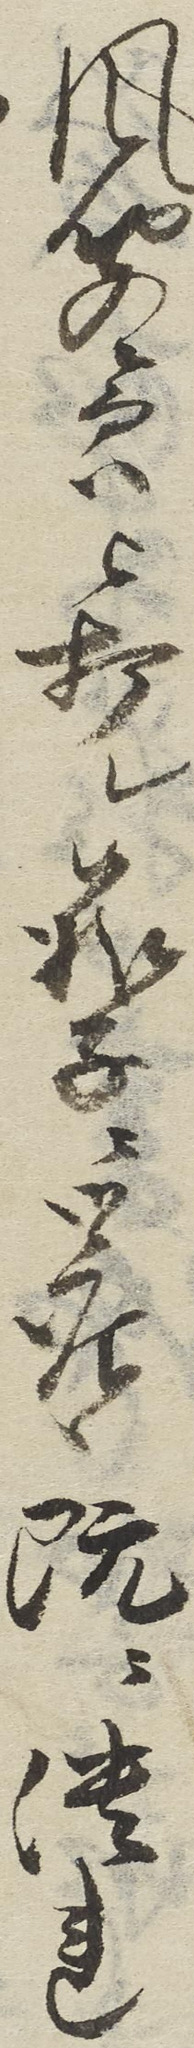風聞二而ハ被打ㇾ候様子二御座候既二潰れ
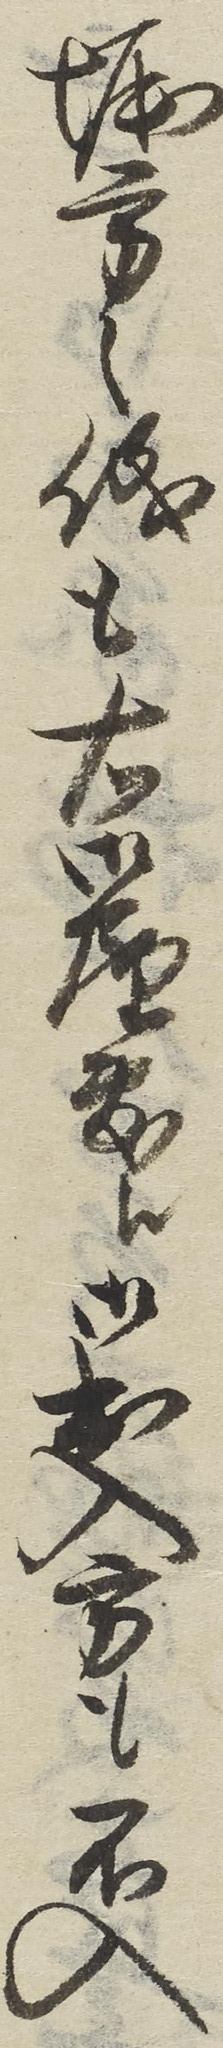堀方之儀も右御屋敷江御出入方も不入

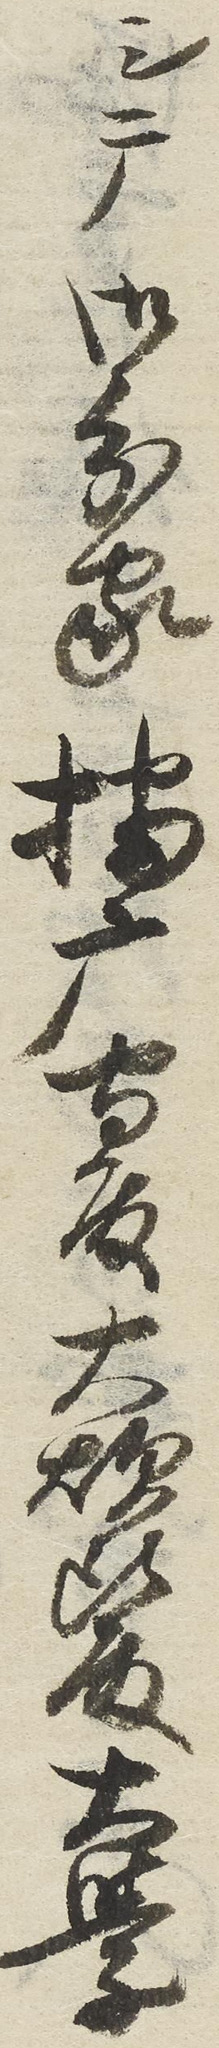シテ御分家播磨守殿大炊頭殿大学
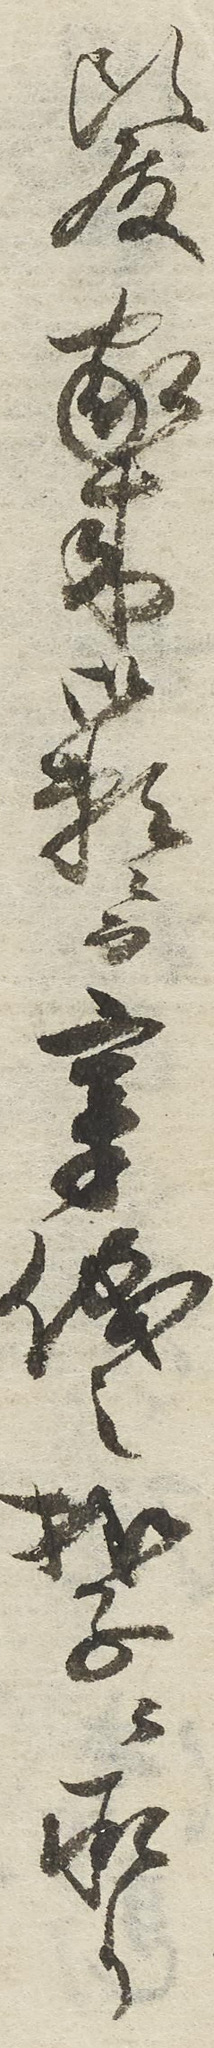頭殿家来御頼二而重儀之様子二承り
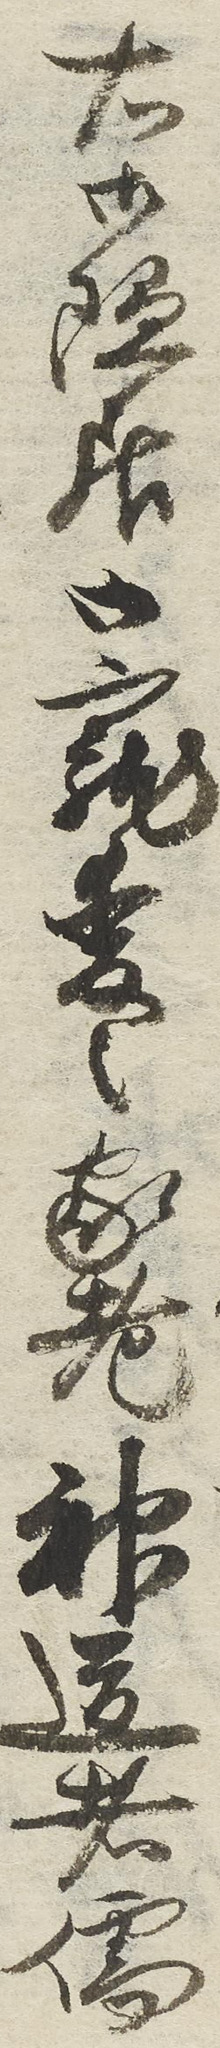右御隠居御寵愛之家老神道者儒
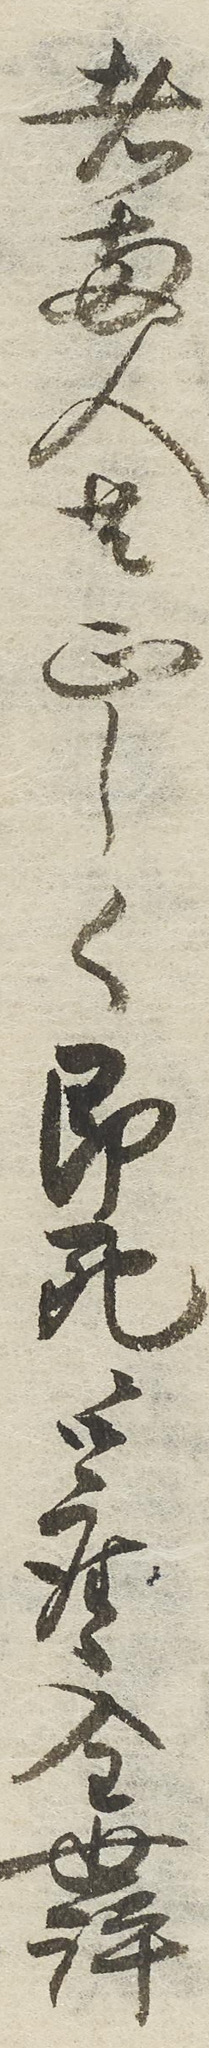者両人共正しく即死二御座候全世評
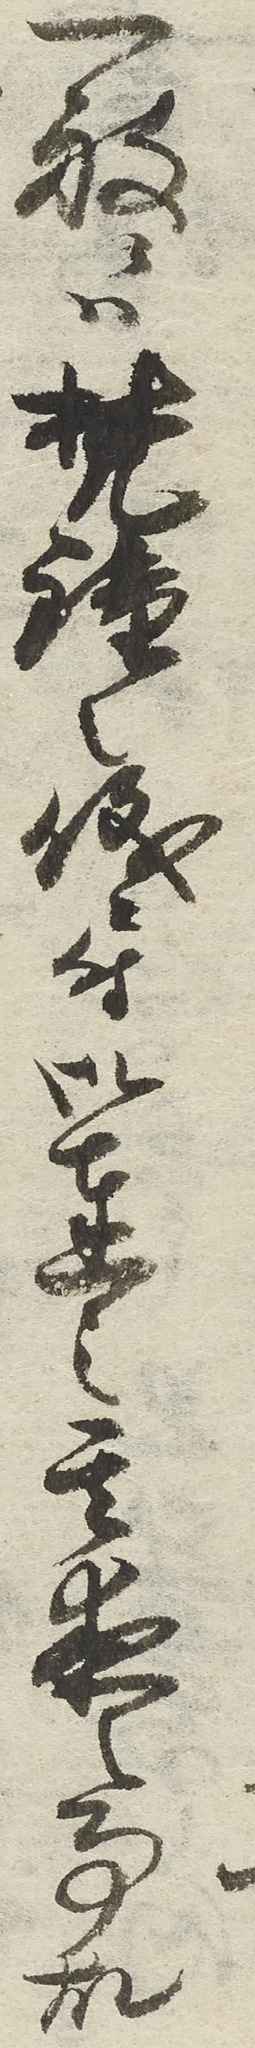一般二ハ梵鐘之儀二付御達之其夜之事故
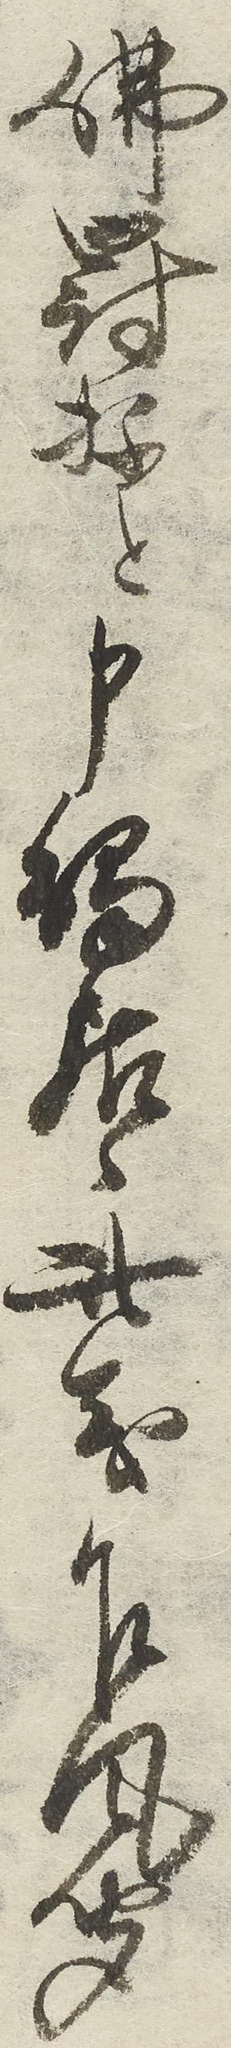仏罰抔と申觸居候此義乍風聞
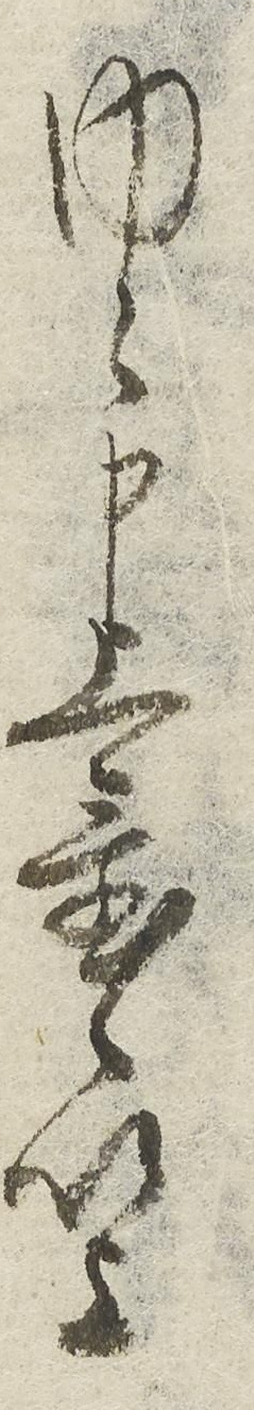内々申上置候以上
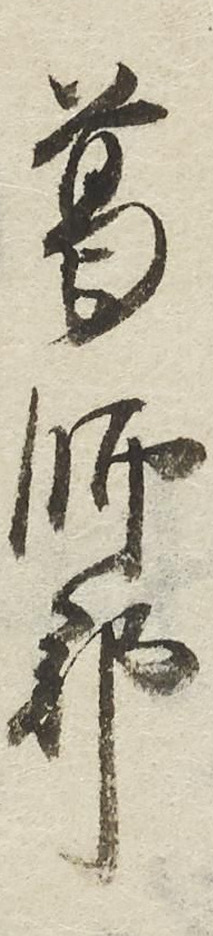葛師郡
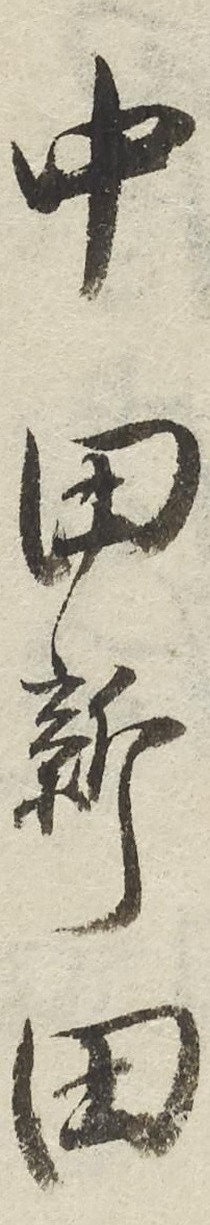中田新田
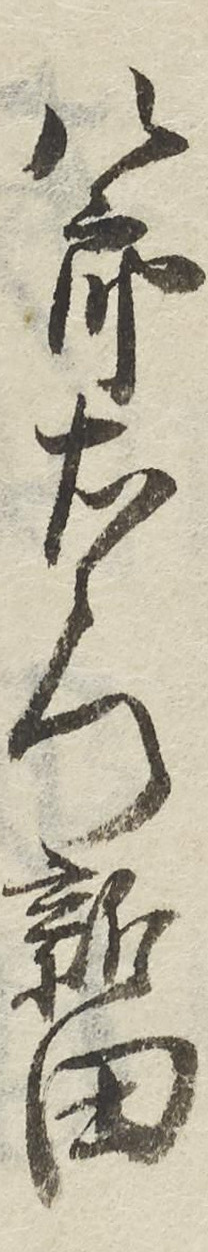八郎右衛門新田
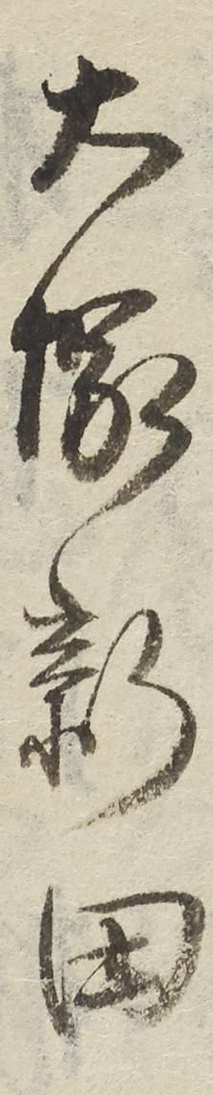大塚新田
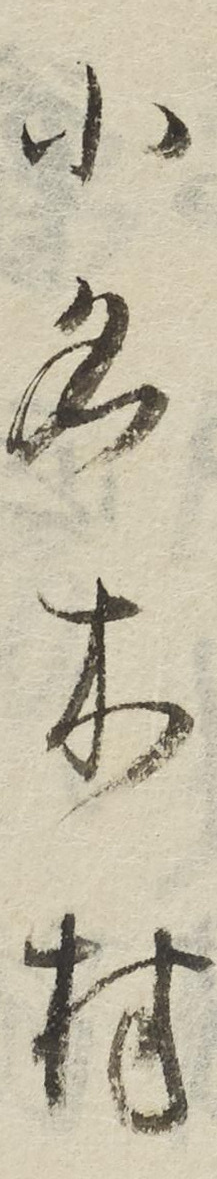小名木村
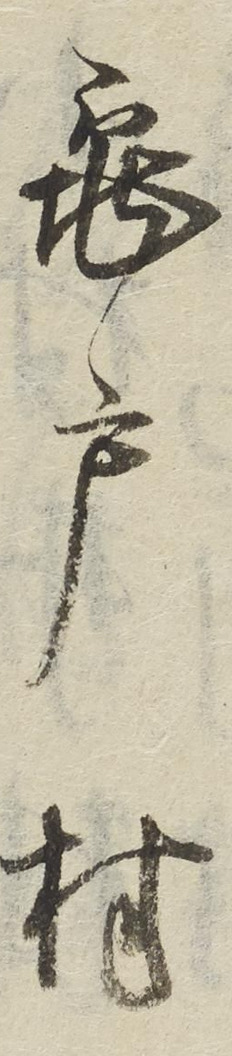亀戸村

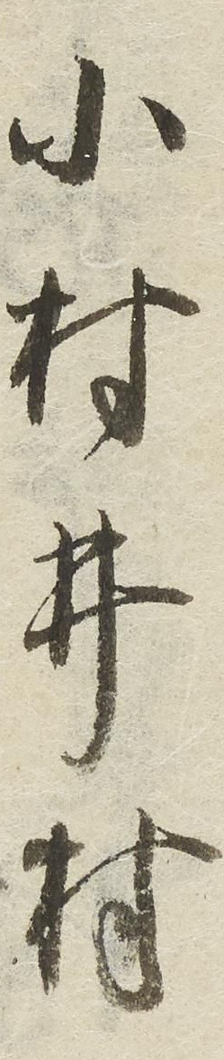小村井村
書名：[梵鐘差出一件]
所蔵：東京大学地震研究所図書室 Earthquake Research Institute Library, The University of Tokyo, JAPAN
